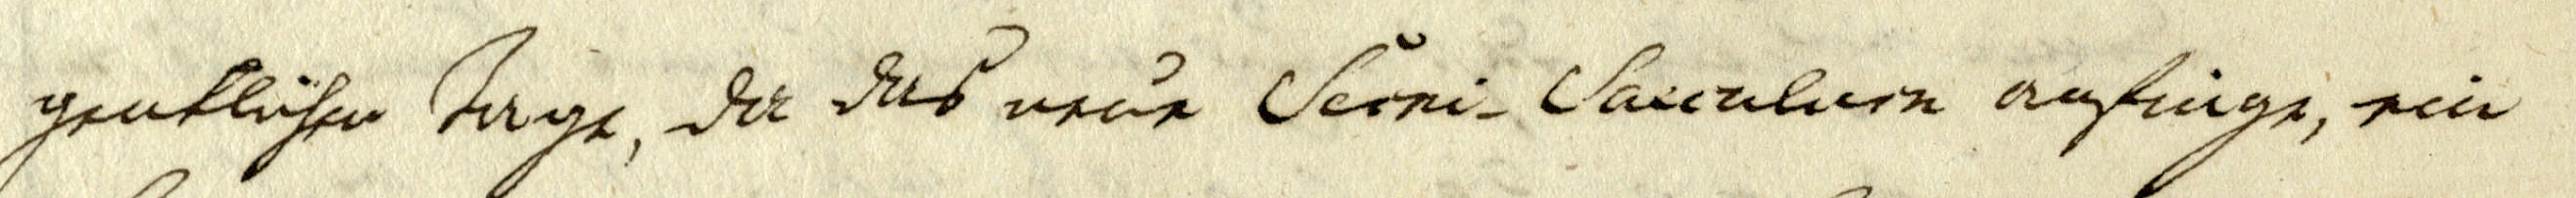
gentlichen Tage da das neue Semi-Saeculum anfinge, ein
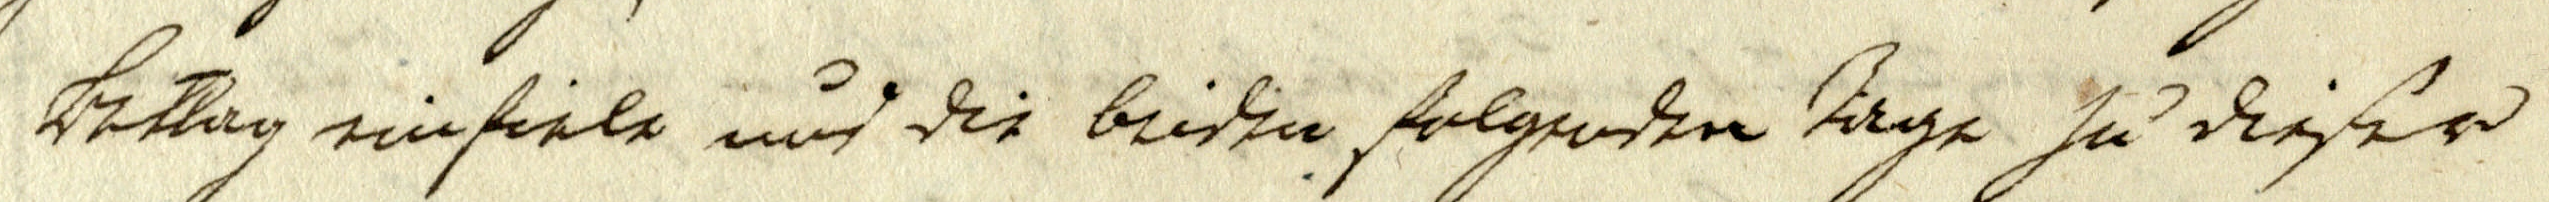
Bettag einfiele und die beiden folgenden Tage zu dieser
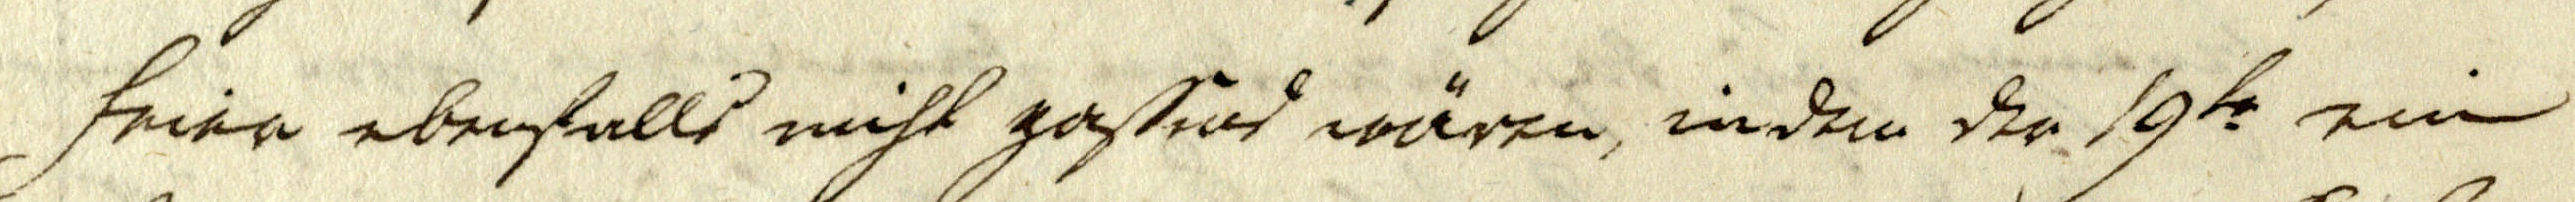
Feier ebenfalls nicht passend wären, indem der 19te ein
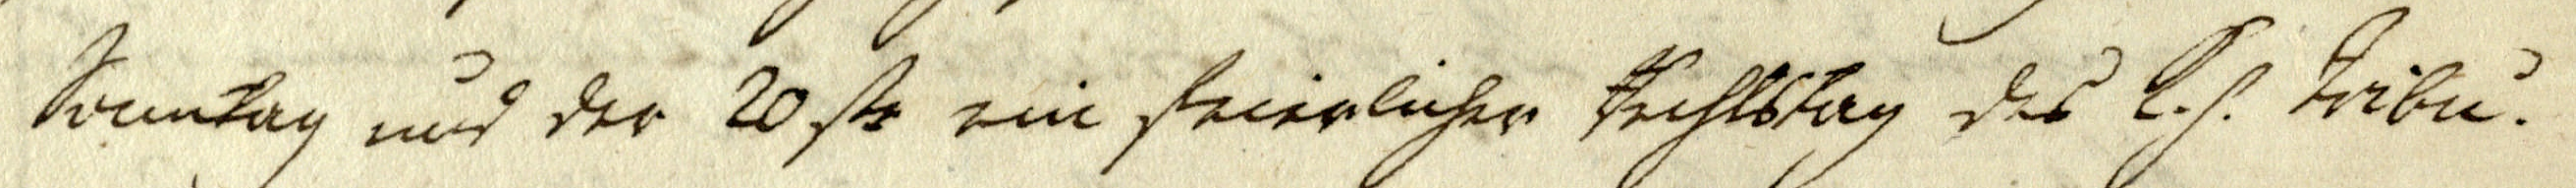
Sonntag und der 20ste ein feierlicher Rechtstag des K. h. Tribu¬
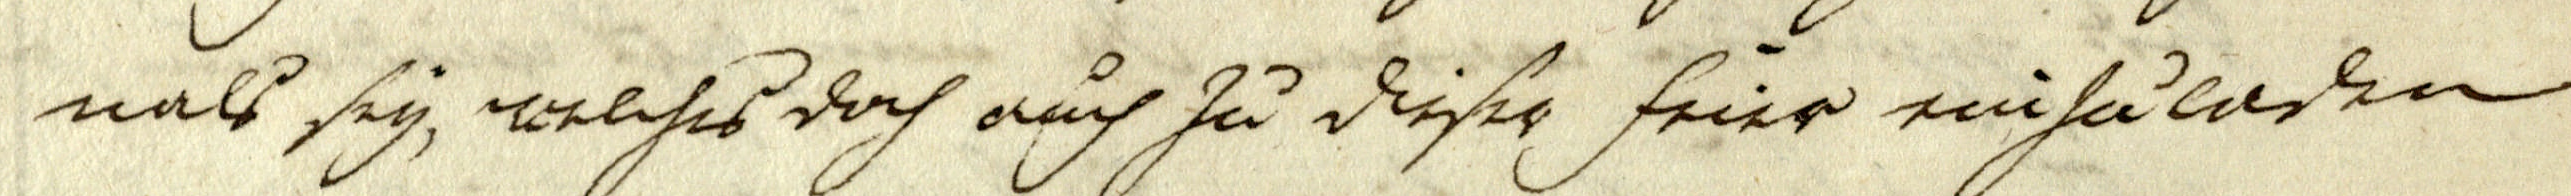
nals seÿ, welches doch auch zu dieser Feier einzuladen
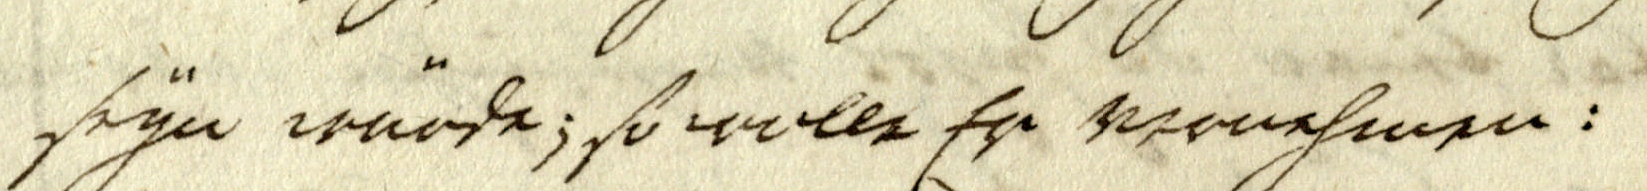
seÿn würde, so wolle Er vernehmen:
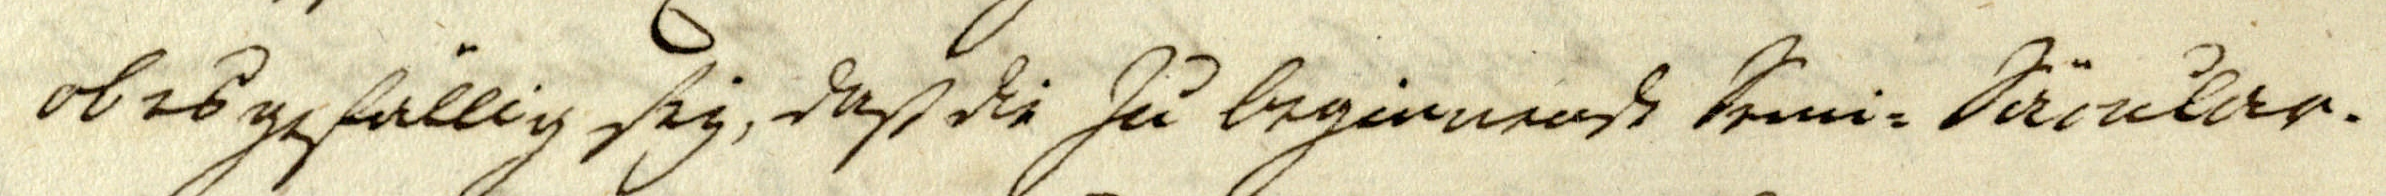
ob es gefällig seÿ, daß die zu beginnende Semi-Säcular¬
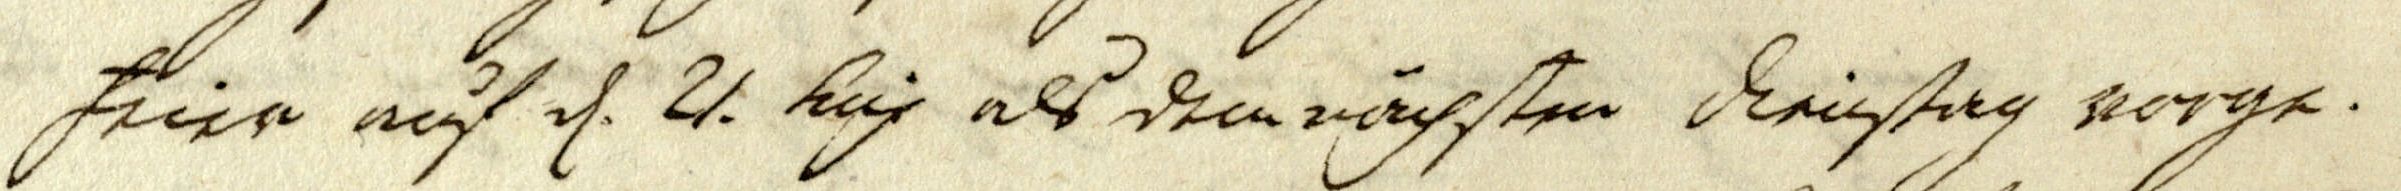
feier auf d. 21. huj. als dem nächsten Dienstag vorge¬
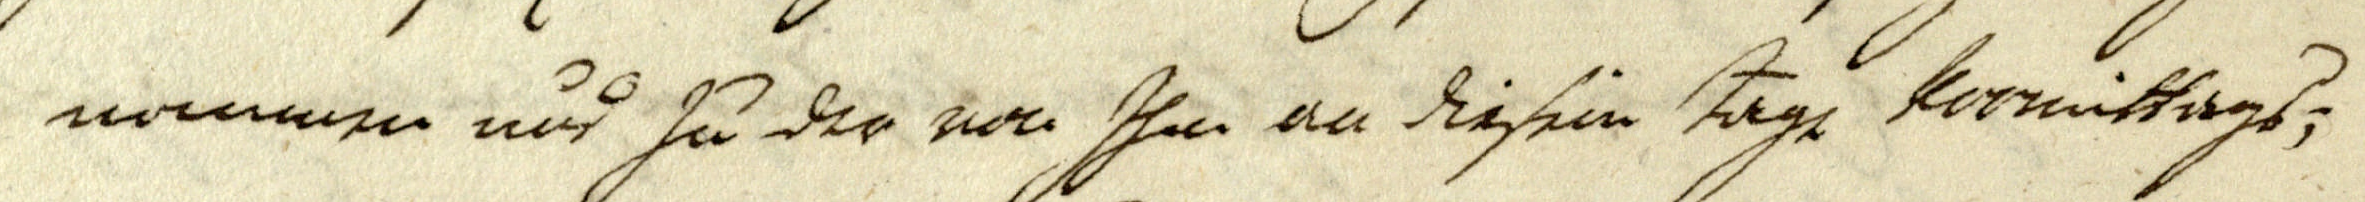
nommen und zu der von Ihm an diesem Tage Vormittags,
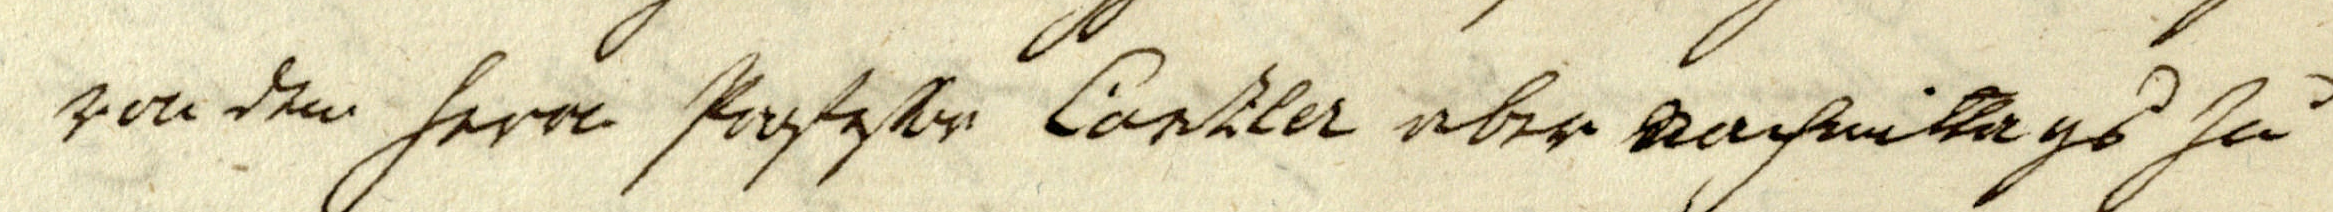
von dem herrn Professor Canzler aber Nachmittags zu
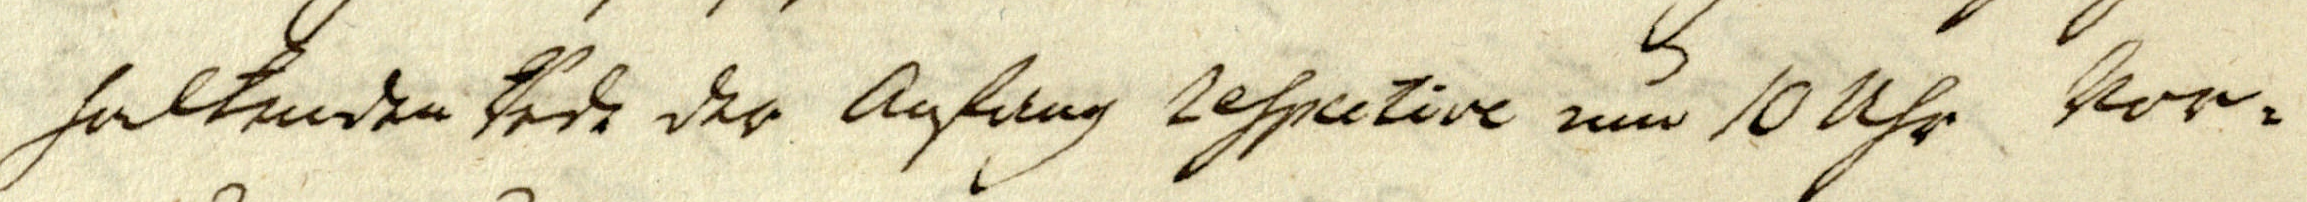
haltenden Rede der Anfang respective um 10 Uhr Vor¬
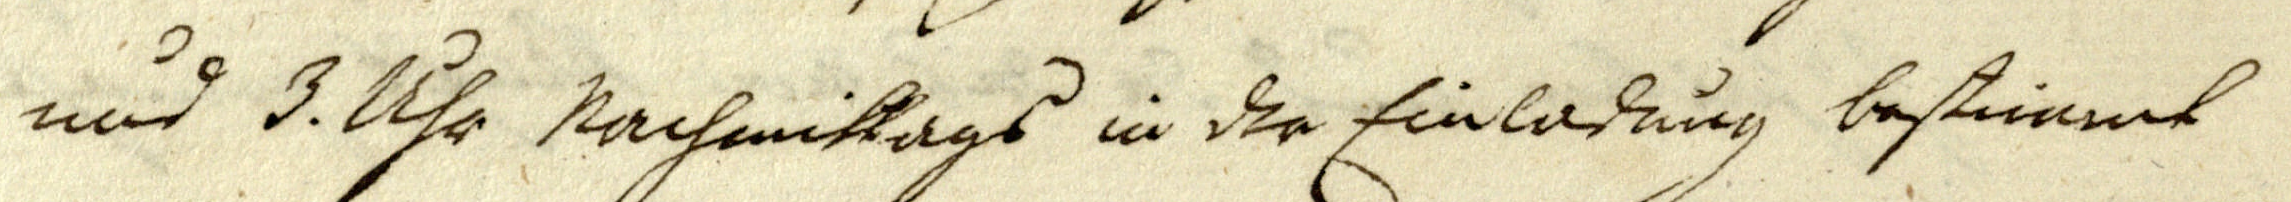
und 3. Uhr Nachmittags in der Einladung bestimmt
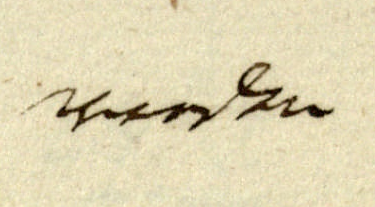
werden
